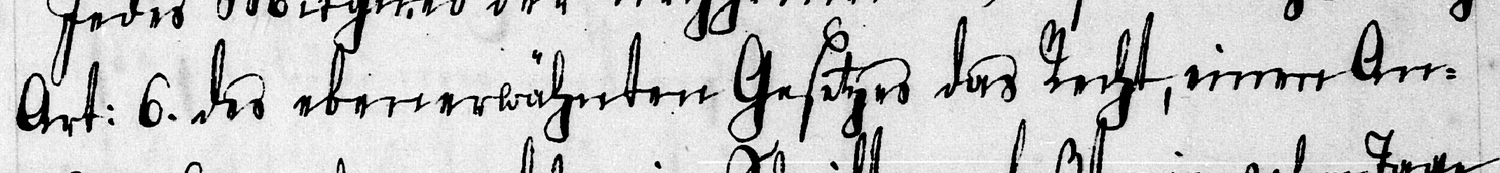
Art: 6. des ebenerwähnten Gesetzes das Recht, einen An¬
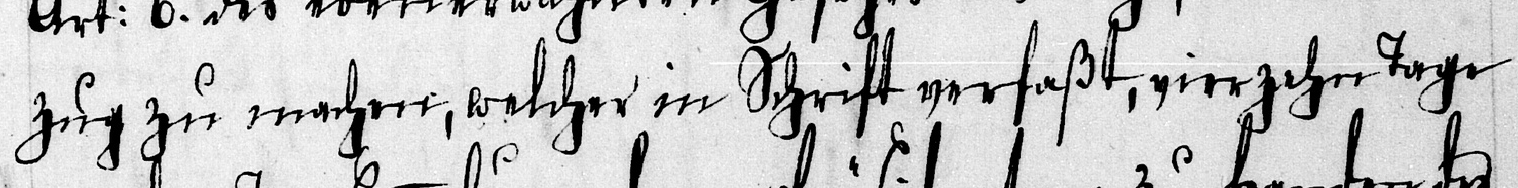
zug zu machen, welcher in Schrift verfaßt, vierzehn Tage
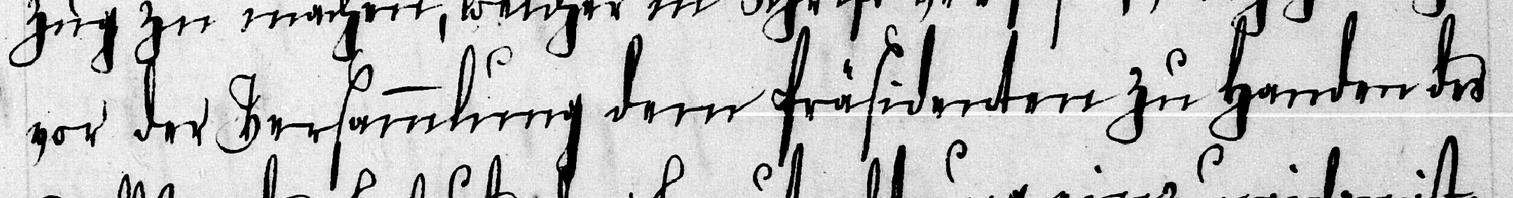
vor der Versammlung dem Präsidenten zu Handen des
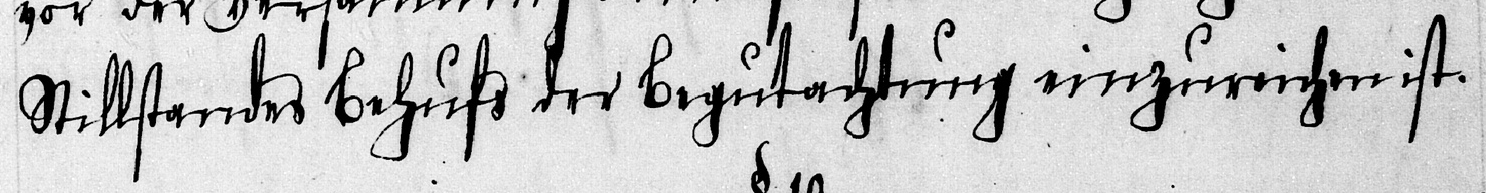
Stillstandes Behufs der Begutachtung einzureichen ist.
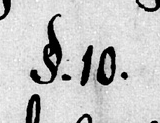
§. 11.
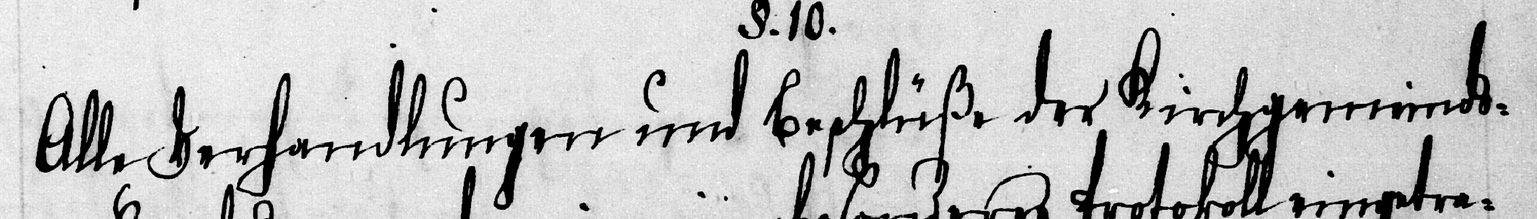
Alle Verhandlungen und Beschlüße der Kirchgemeinds¬
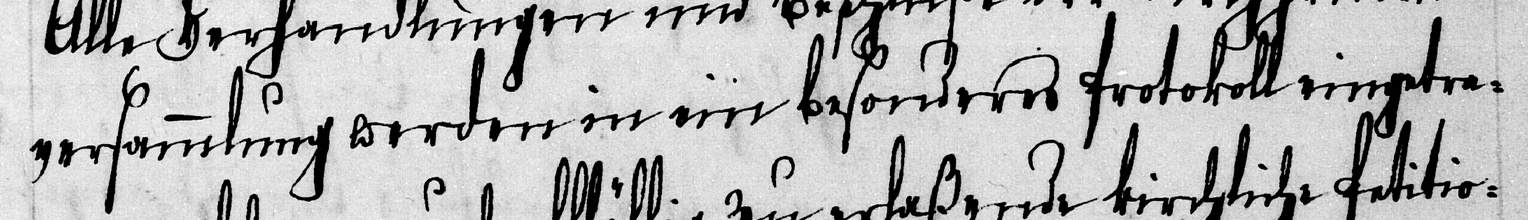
versammlung werden in ein besonderes Protokoll eingetra¬
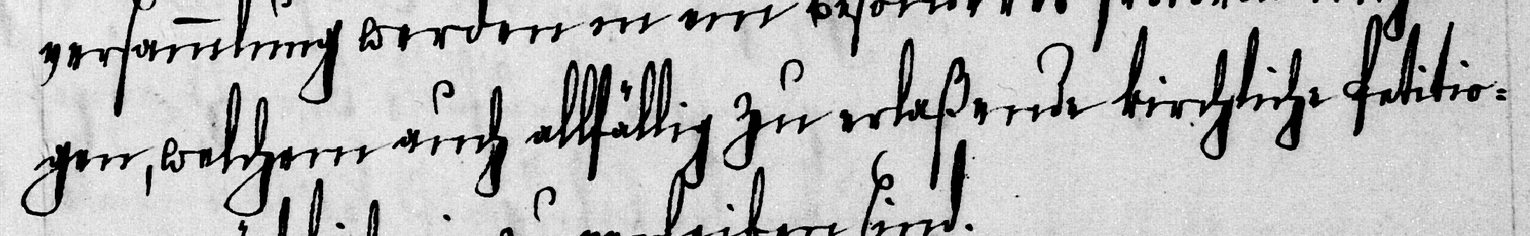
gen, welchem auch allfällig zu erlaßende kirchliche Petitio¬
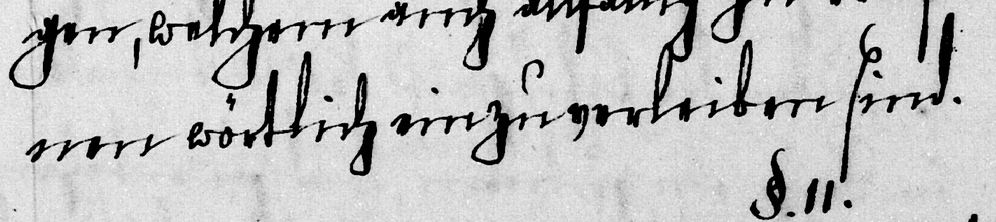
nen wörtlich einzuverleiben sind.
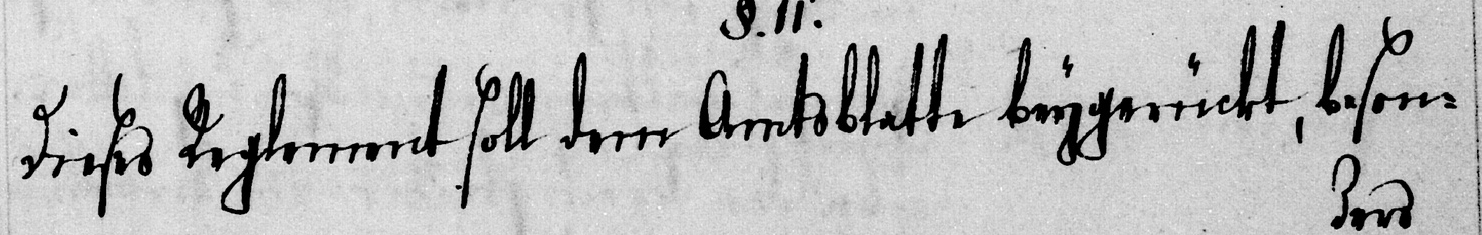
eses Reglement soll dem Amtsblatte beygerückt, beson-
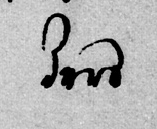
Der
